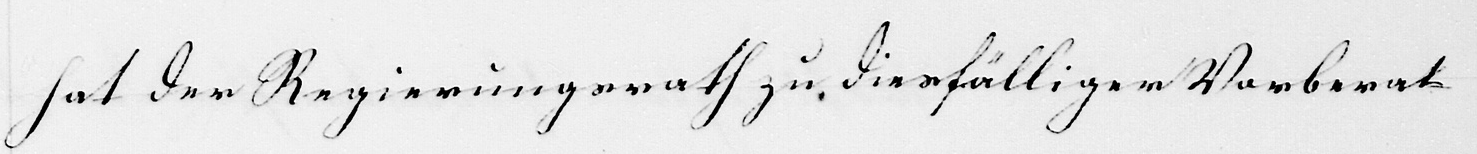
hat der Regierungsrath zu diesfälliger Vorberat¬
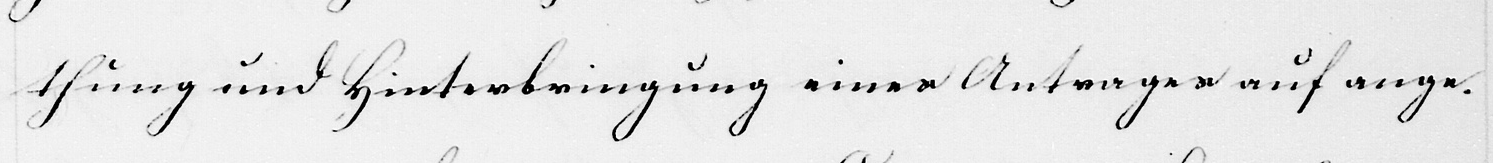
hung und Hinterbringung eines Antrages auf ange¬
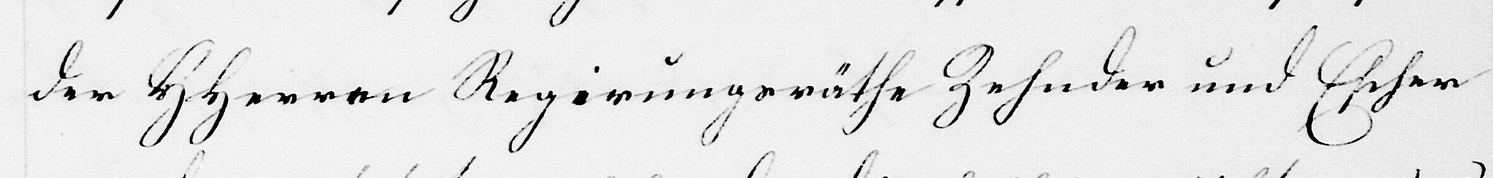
der HHerren Regierungsräthe Zehnder und Escher
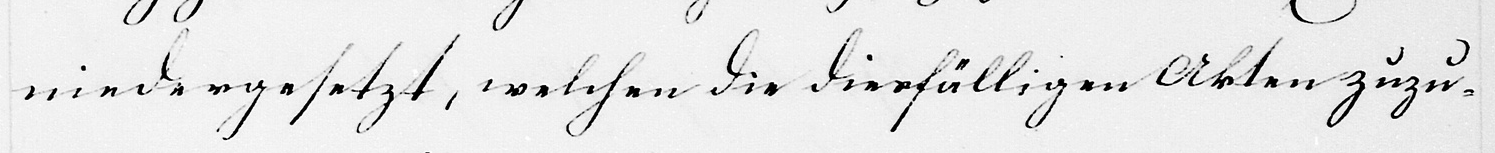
niedergesetzt, welchen die diesfälligen Akten zuzu¬
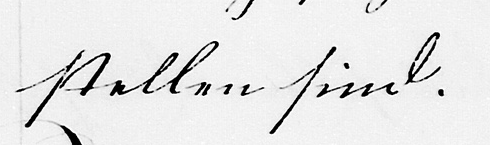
stellen sind.
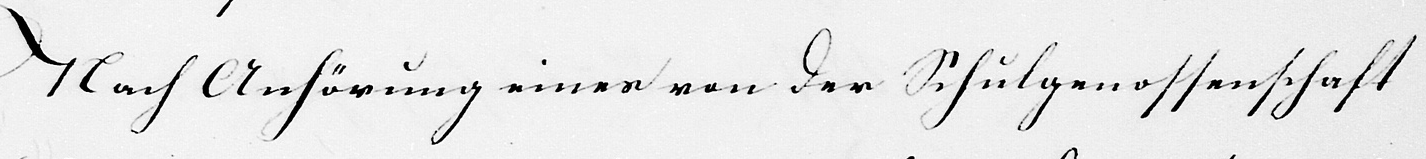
Nach Anhörung eines von der Schulgenossenschaft
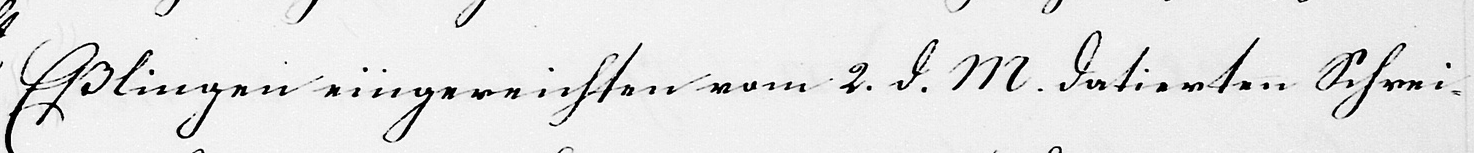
Eßlingen eingereichten vom 2. d. M. datierten Schrei¬
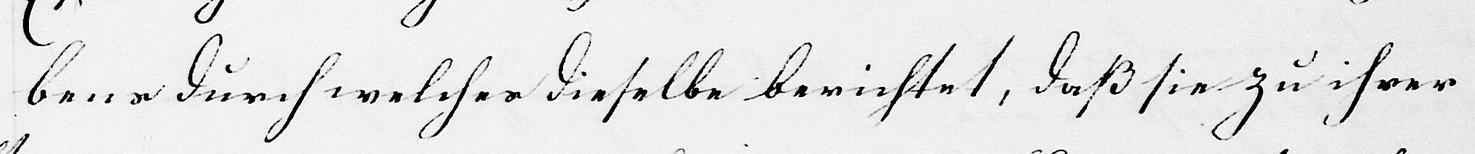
bens durch welches dieselbe berichtet, daß sie zu ihrer
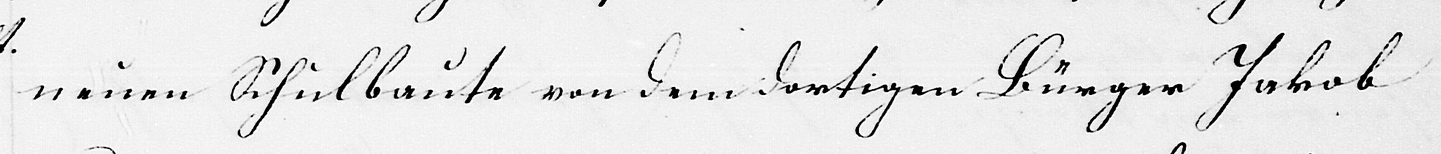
neuen Schulbaute von dem dortigen Bürger Jakob
